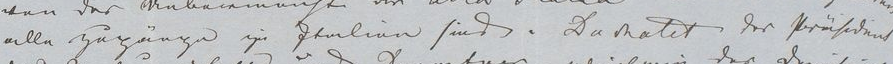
alle Zugänge zu Italien sind. Duchalet der Präsident
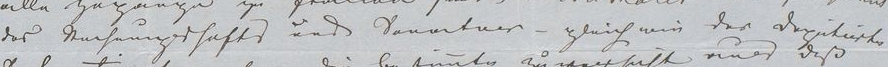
der Rechnungshofs und Senator – gleich wie der Deputirte
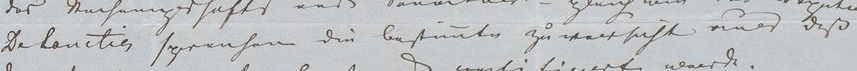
De Sanctis sprechen die bestimmte Zuversicht aus, daß
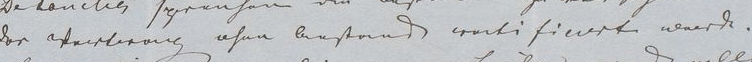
der Vertrag ohne Anstand ratificirt werde.
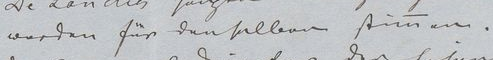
werden für denselben stimmen.
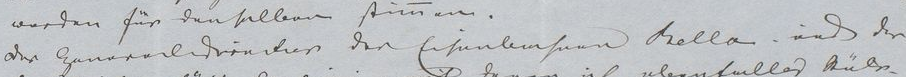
Der Generaldirektor der Eisenbahnen Bella – und der
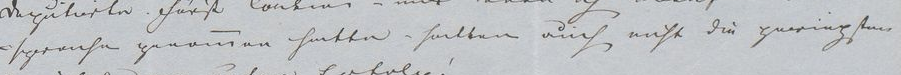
sprache genommen hatte – hatten auch nicht die geringsten
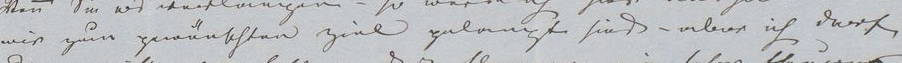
wir zum gewünschten Ziel gelangt sind – aber ich darf
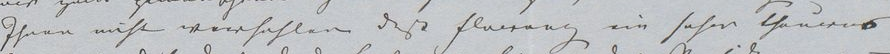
Ihnen nicht verhehlen daß Florenz ein sehr theurer
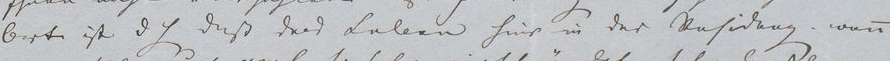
Ort ist dh daß das Leben hier in der Residenz – wenn
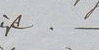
ist. –
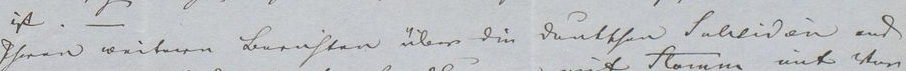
Ihren weitern Berichten über die deutschen Subsidien und
